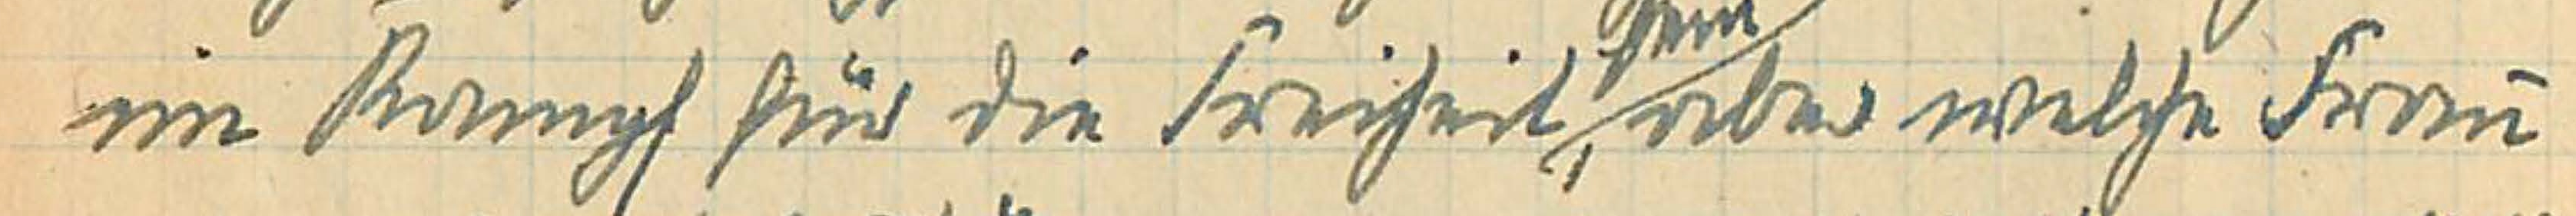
im Kampf für die Freiheit, aber welche Frau
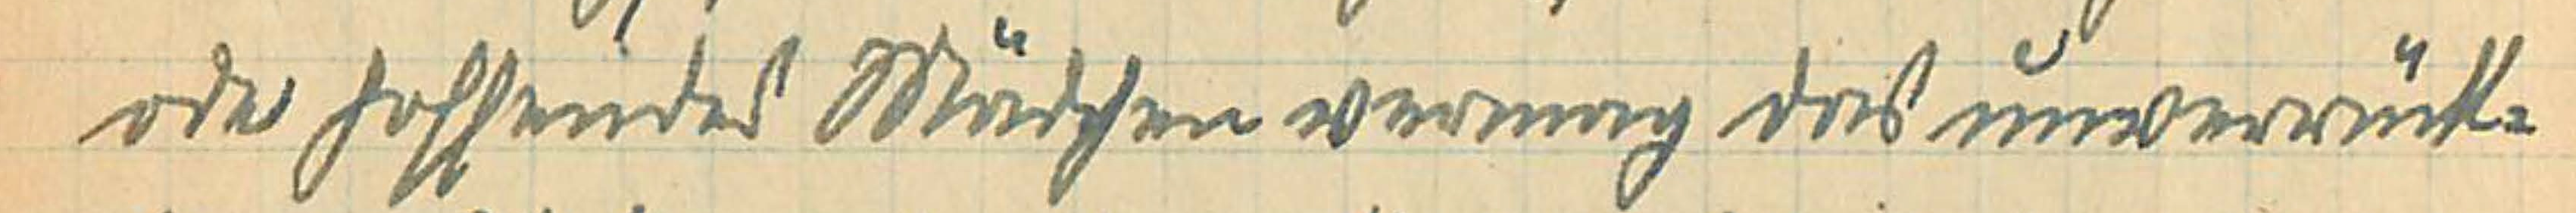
oder hoffendes Mädchen vermag das unverrück-
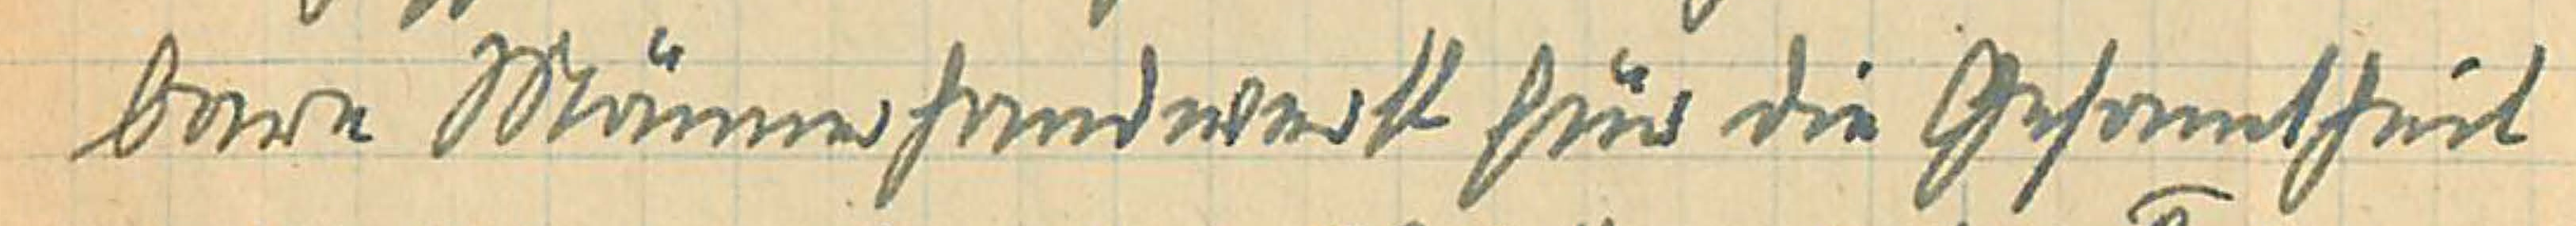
bare Männerhandwerk für die Gesamtheit
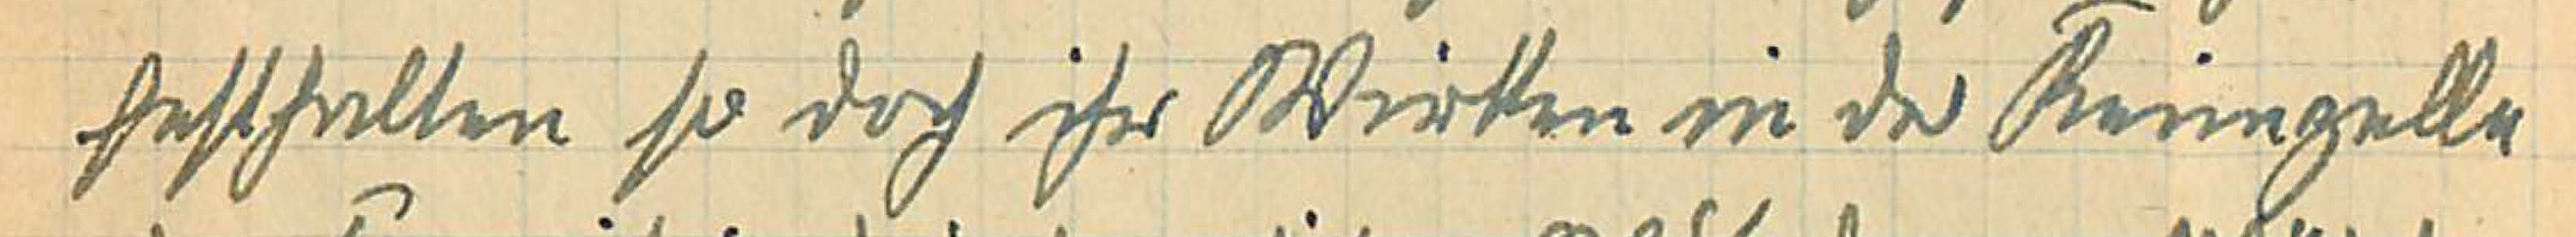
festhalten so doch ihr Wirken in der Keimzelle
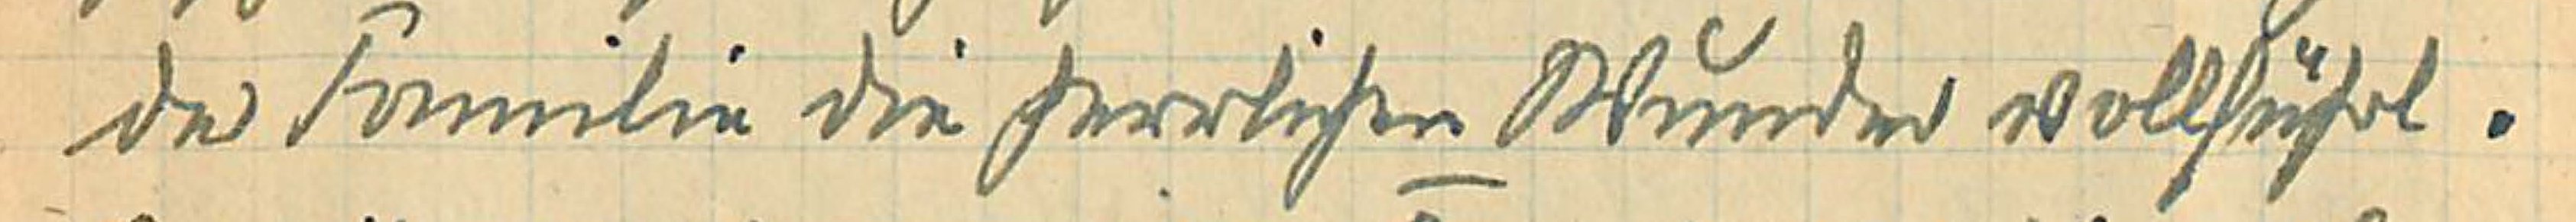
der Familie die herrlichen Wunder vollführt.
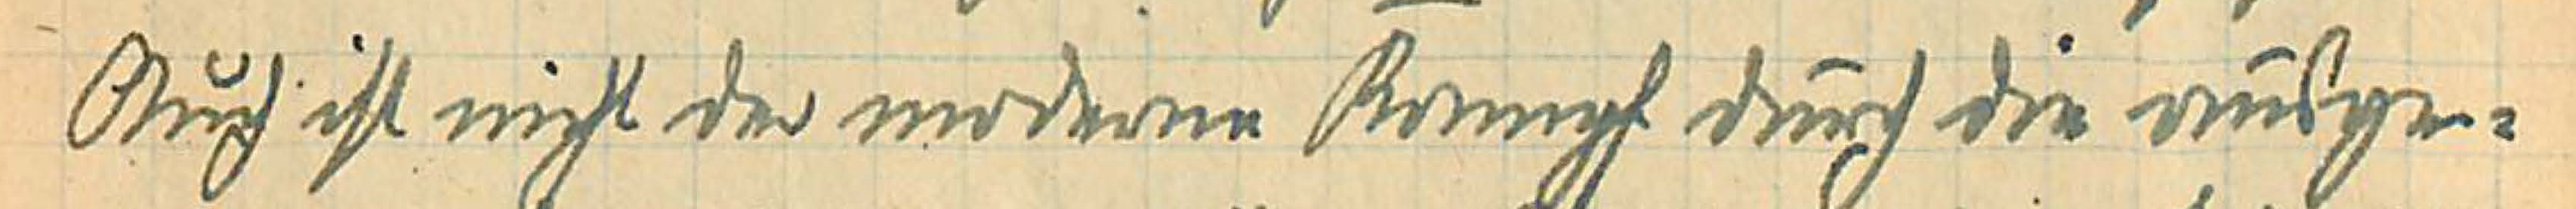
Auch ist nicht der moderne Kampf durch die ausge-
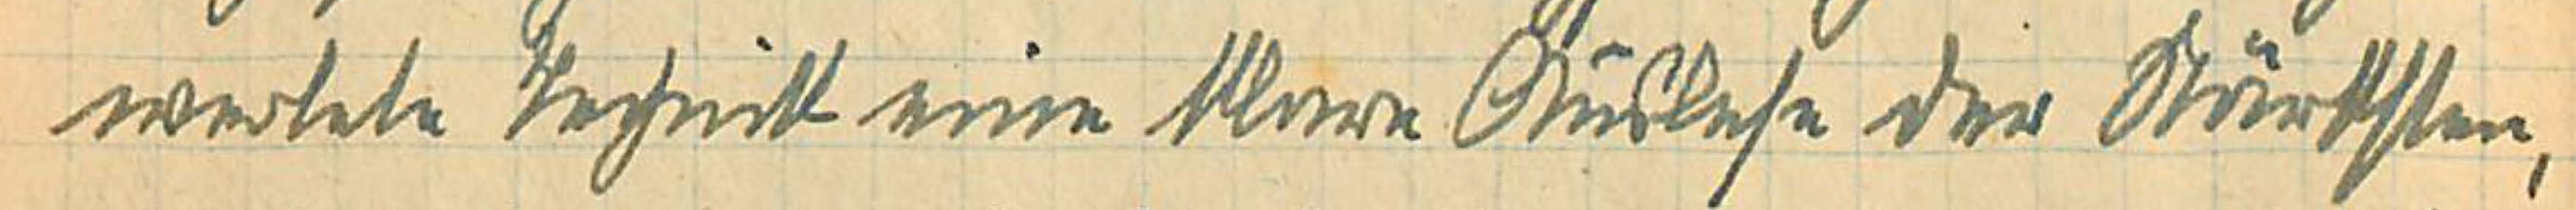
wertete Technik eine klare Auslese der Stärksten
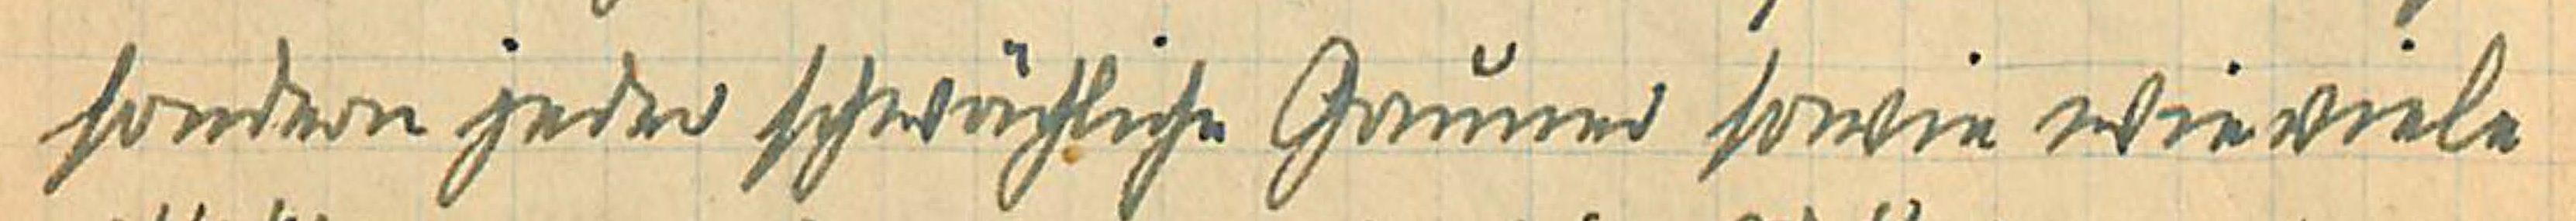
sondern jeder schwächliche Gauner sowie wieviele
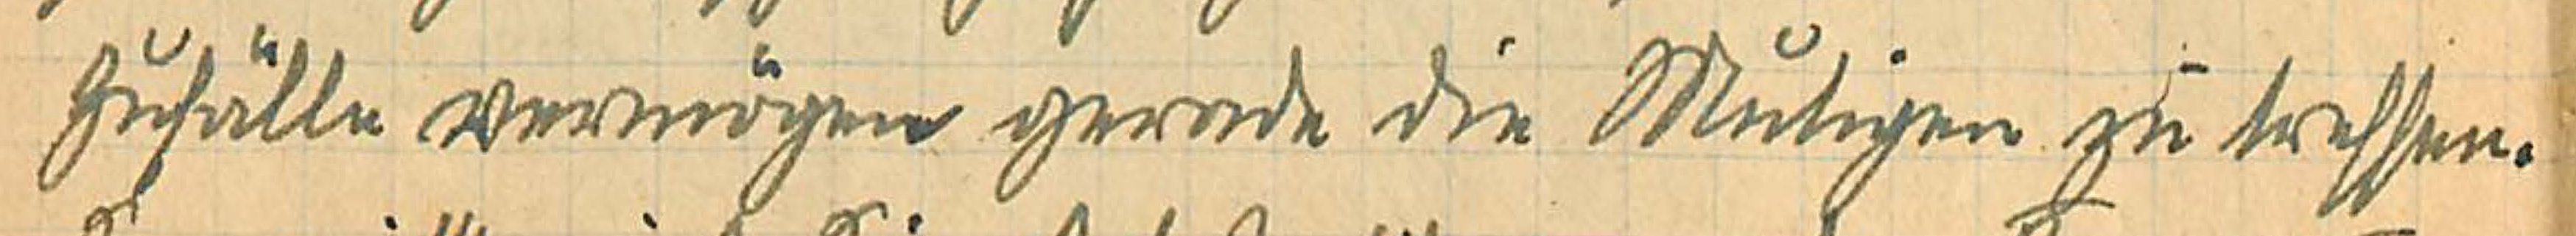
Zufälle vermögen gerade die Mutigen zu treffen.
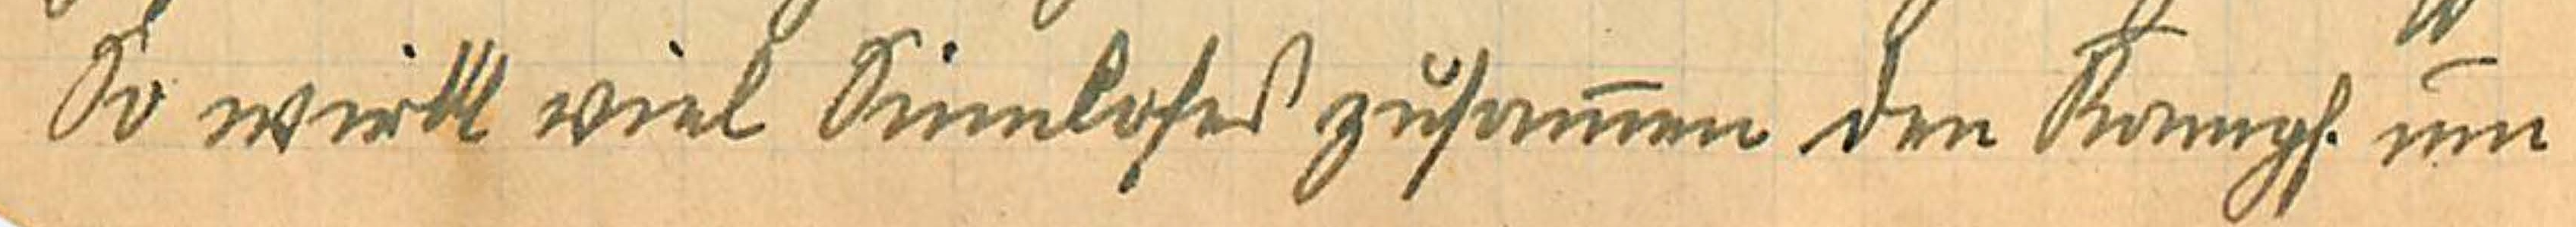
So wirkt viel Sinnloses zusammen den Kampf um
